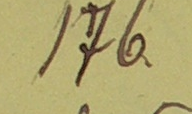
176
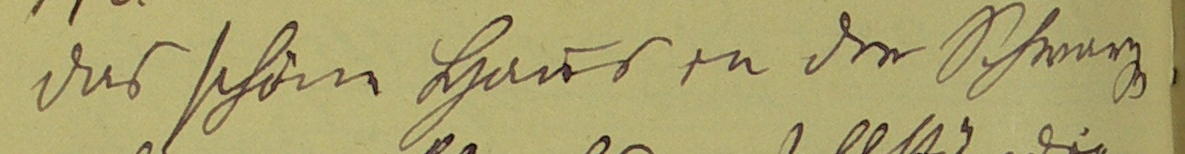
das schöne Haus in der Schwarz¬
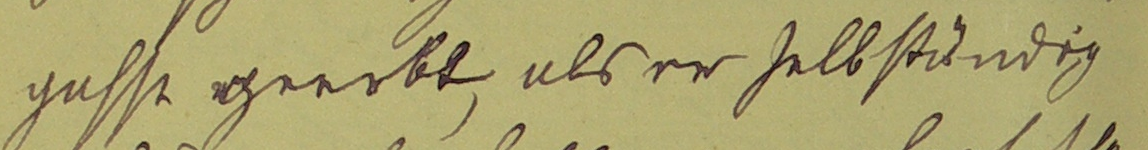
gasse geerbt, als er selbstständig
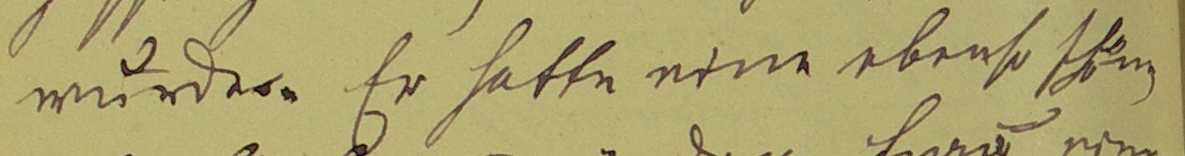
wurde. Er hatte eine ebenso schöne
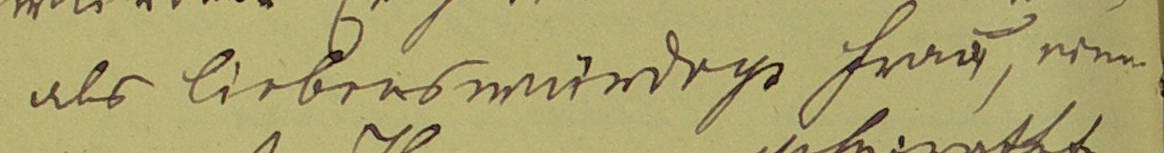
als liebenswürdige Frau, eine
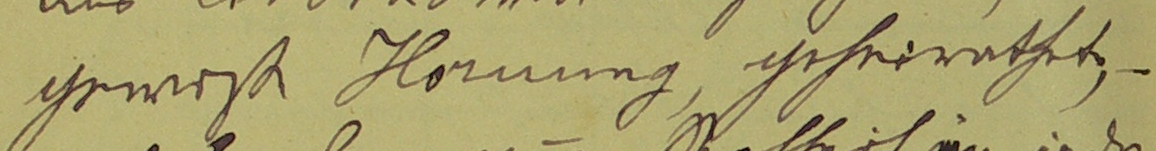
gewisse ??? geheirathet,--
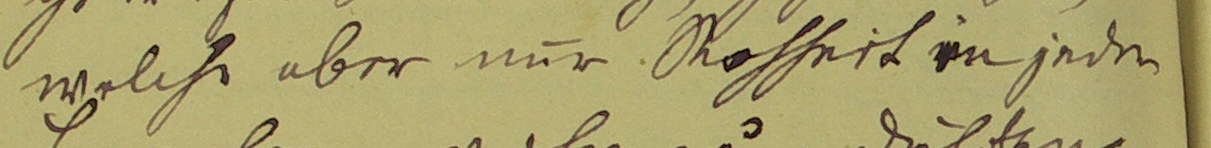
welche aber nur Rohheit in jeder
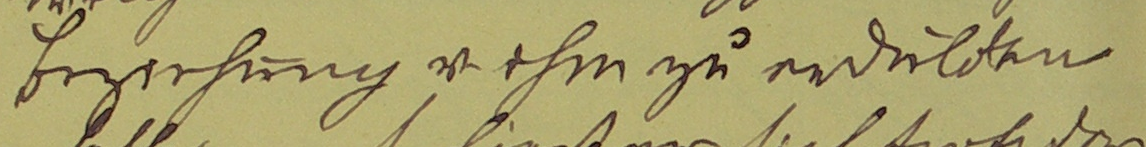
Beziehung v. ihm zu erdulden
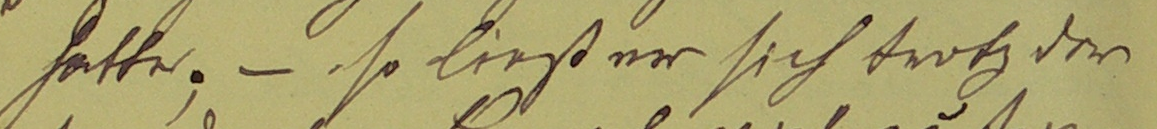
hatte;- so ließ er sich trotz der
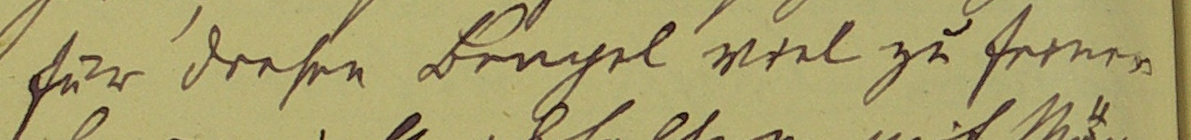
für diesen Bengel viel zu feinen
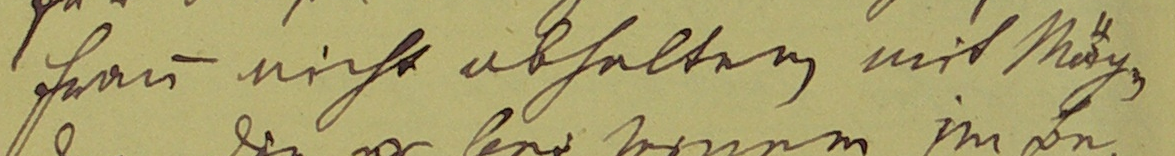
Frau nicht abhalten, mit Mäg¬
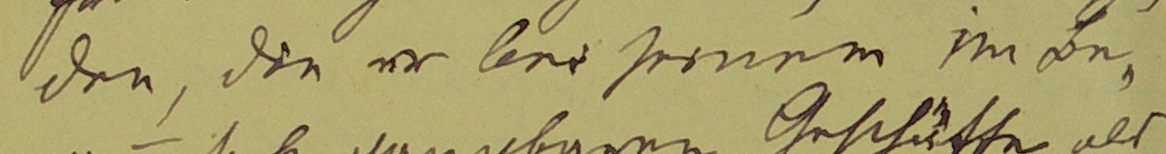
den, die er bei seinem im Be¬
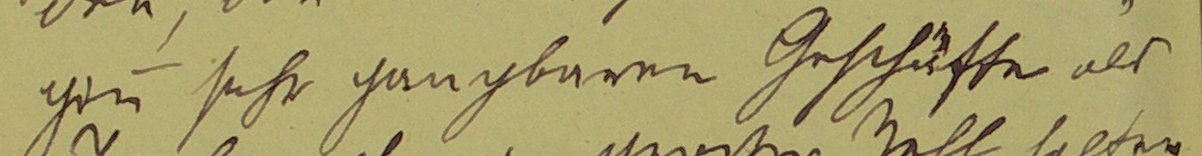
ginn sehr gangbaren Geschäften als
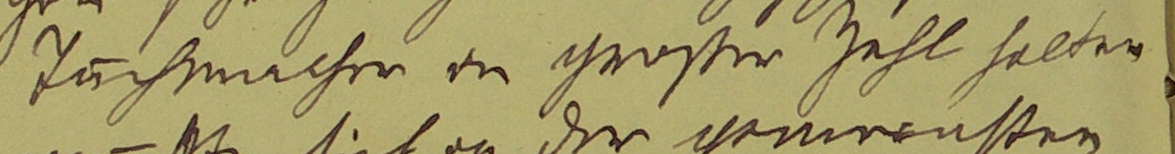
Tuchmacher in großer Zahl halten
